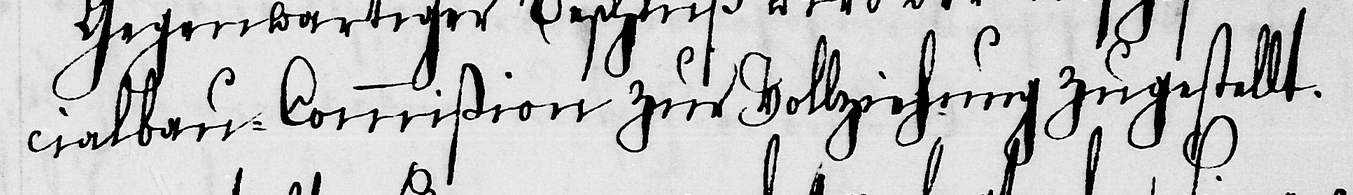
cialbau-Commißion zur Vollziehung zugestellt.
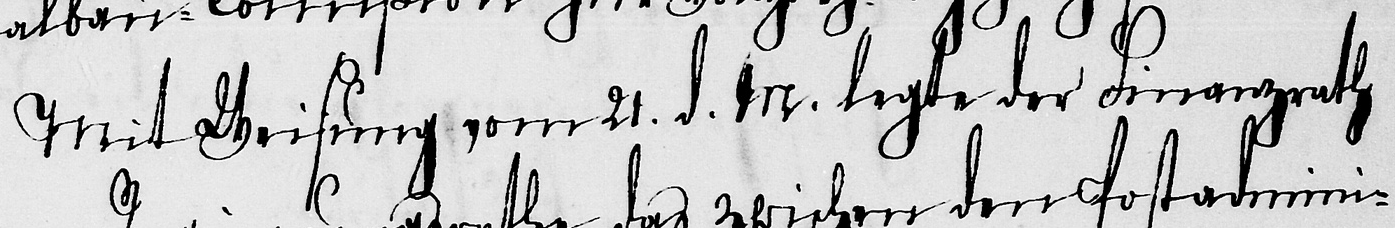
Mit Weisung vom 21. d. M. legte der Finanzrath
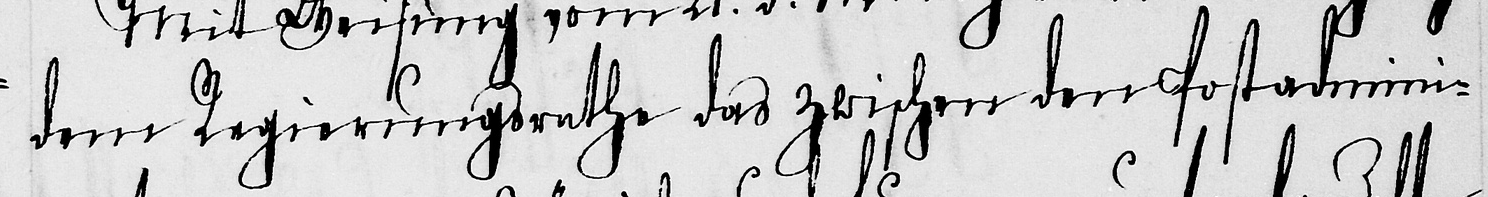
dem Regierungsrathe das zwischen den Postadmini¬
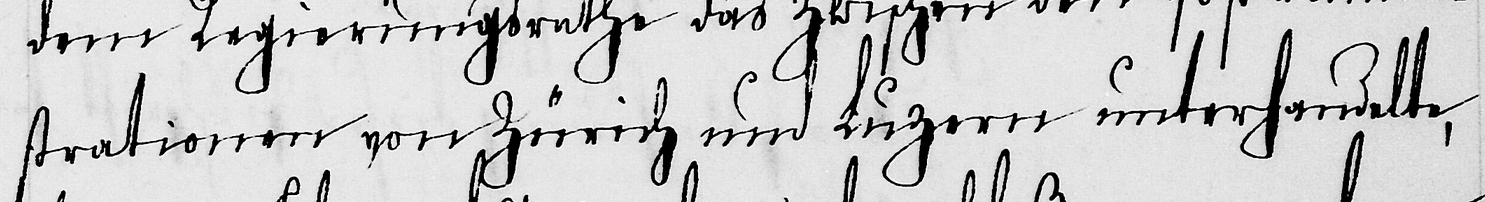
strationen von Zürich und Luzern unterhandelte,
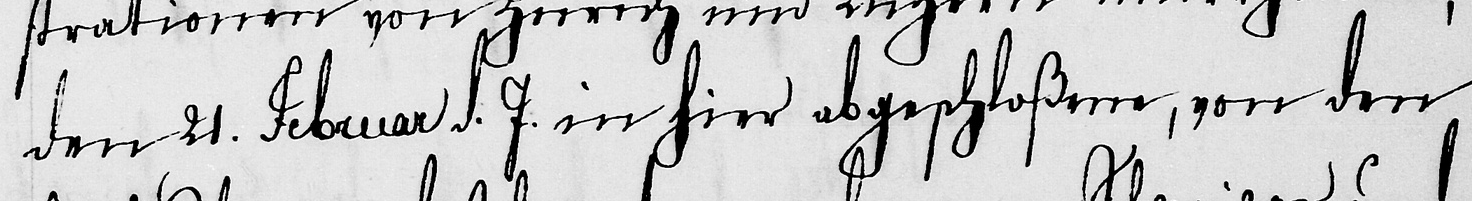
den 21. Februar d. J. in hier abgeschloßene, von den
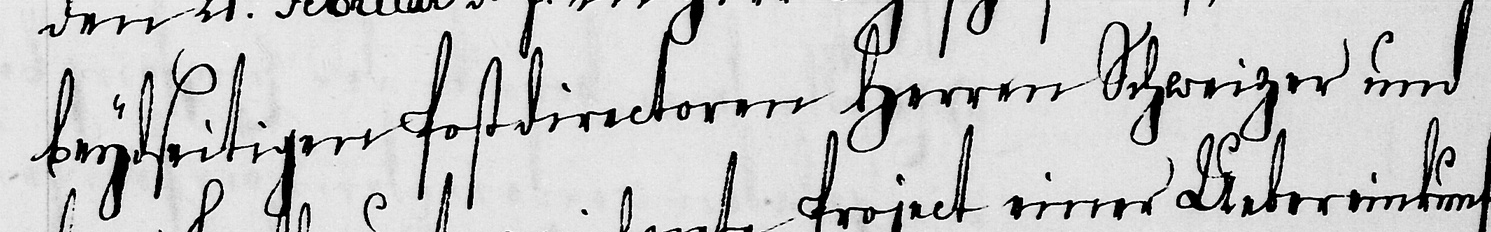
beydseitigen Postdirectoren Herren Schweizer und
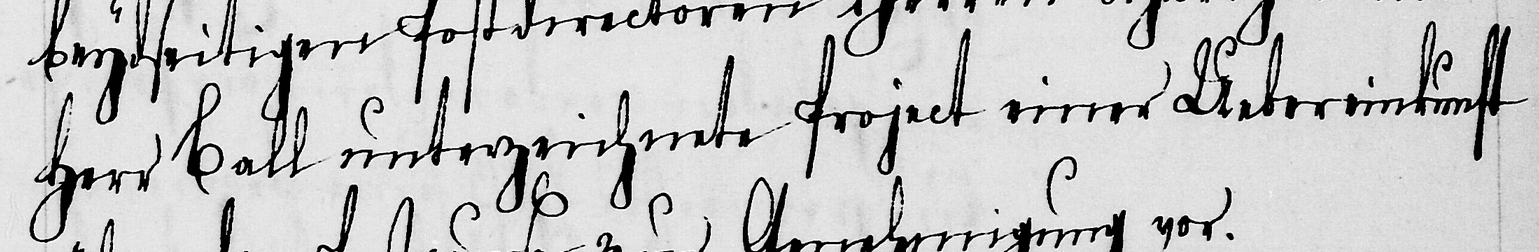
Herr Ball unterzeichnete Project einer Uebereinkunft
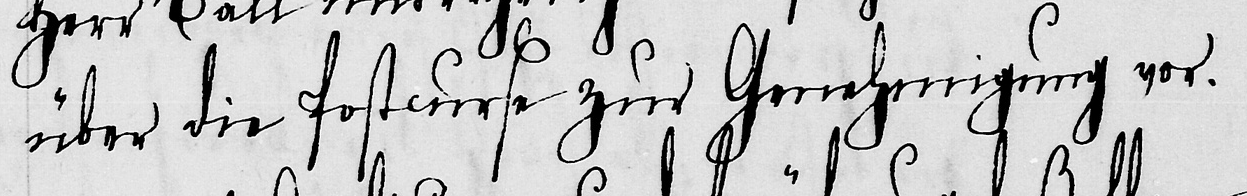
über die Postcurse zur Genehmigung vor.
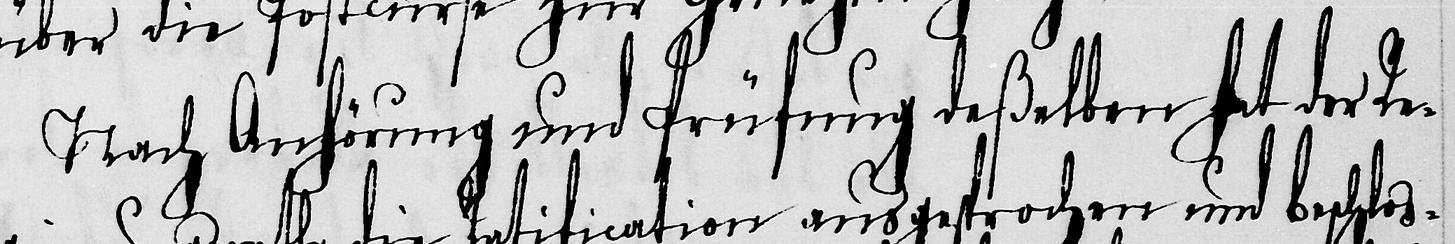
Nach Anhörung und Prüfung deßelben hat der R¬
